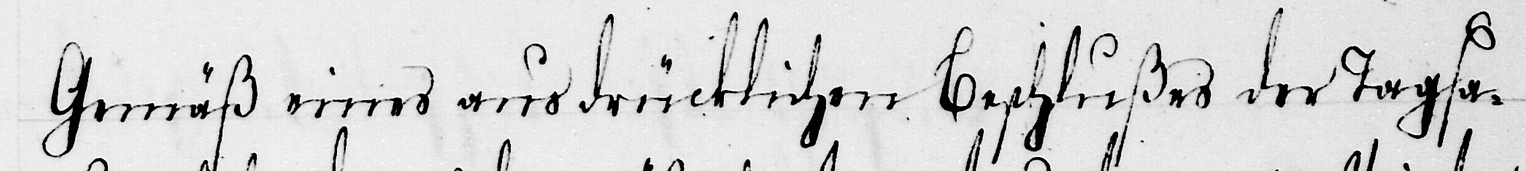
Gemäß eines ausdrücklichen Beschlußes der Tagsa¬
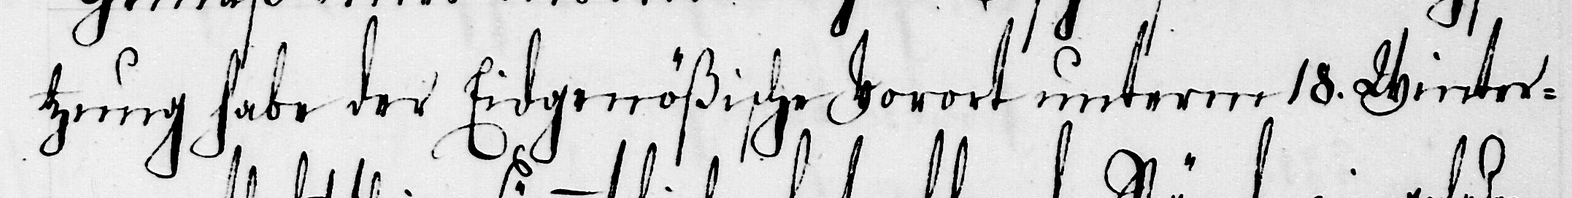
tzung habe der Eidgenößische Vorort unterm 18. Winter¬
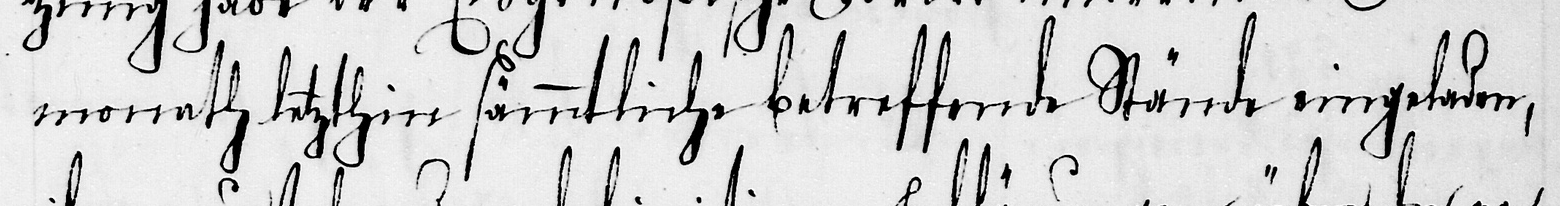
monath letzthin sämmtliche betreffende Stände eingeladen,
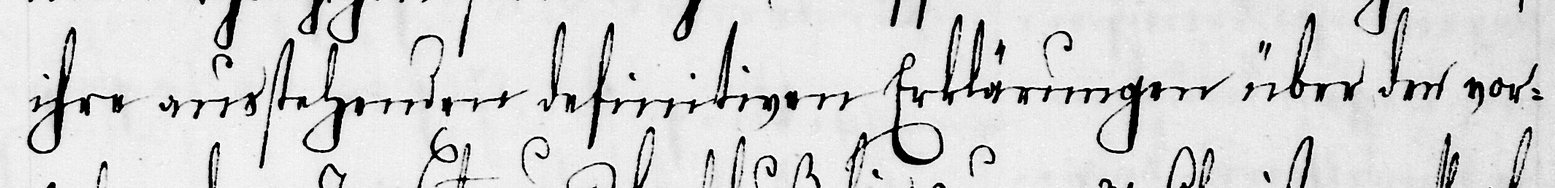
ihre ausstehenden definitiven Erklärungen über den vor¬
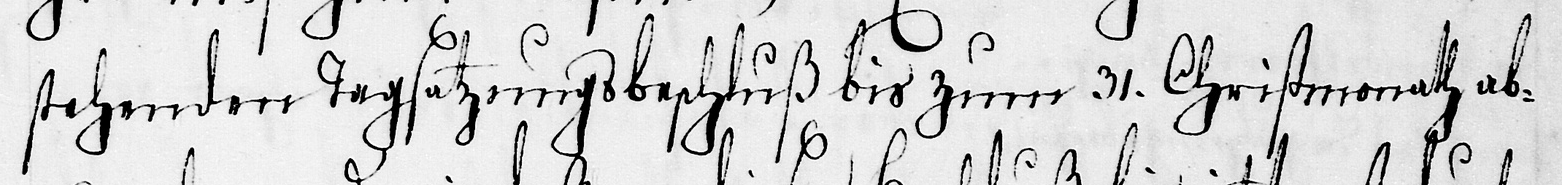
stehenden Tagsatzungsbeschluß bis zum 31. Christmonath ab¬
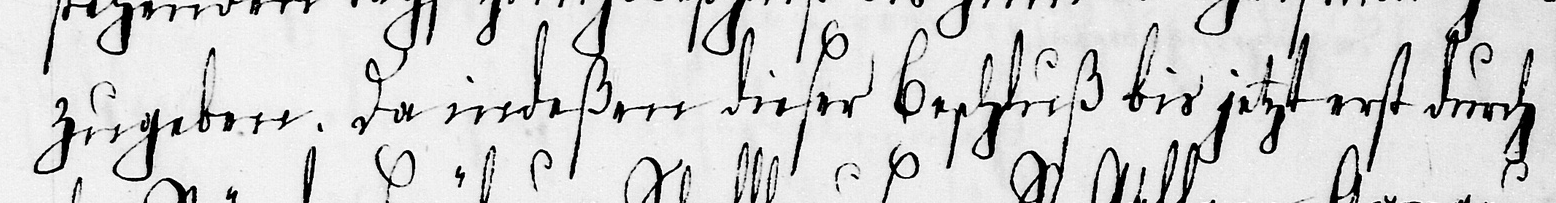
zugeben. Da indeßen dieser Beschluß bis jetzt erst durch
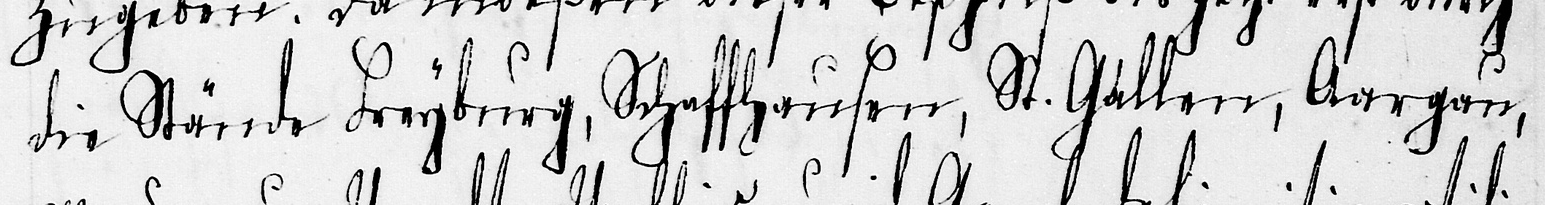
die Stände Freyburg, Schaffhausen, St. Gallen, Aargau,
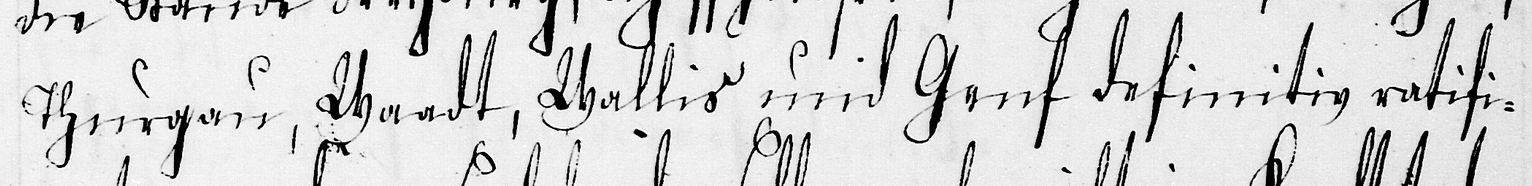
Thurgau, Waadt, Wallis und Genf definitiv ratifi¬
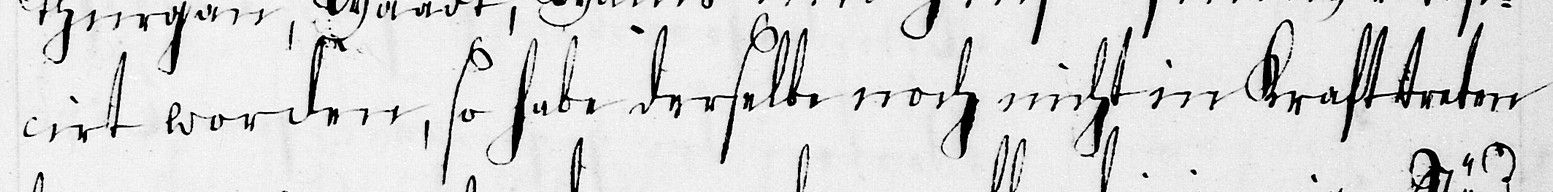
cirt worden, so habe derselbe noch nicht in Kraft treten
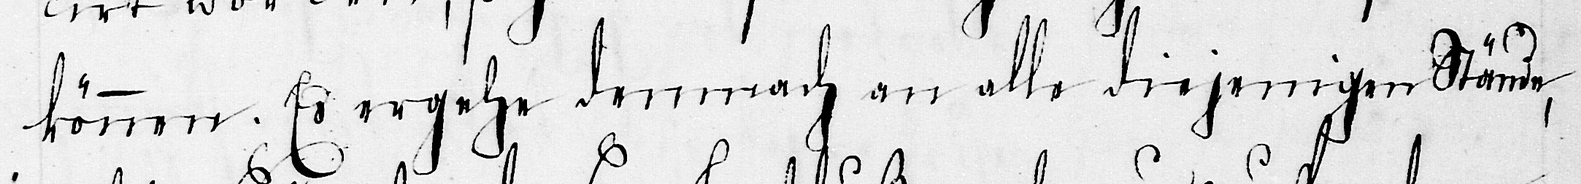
können. Es ergehe demnach an alle diejenigen Stände,
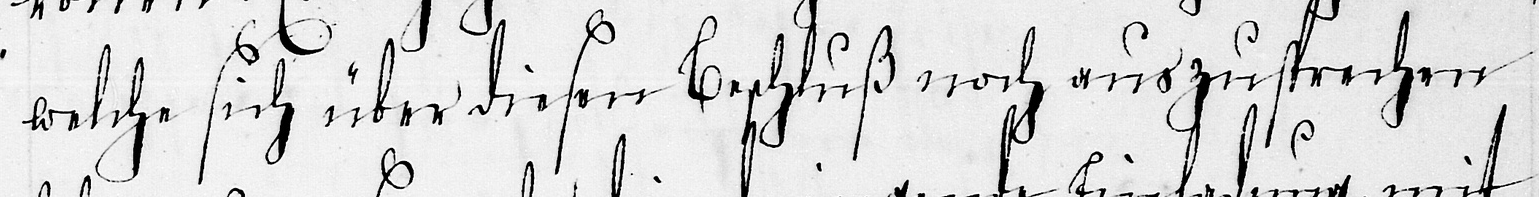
welche sich über diesen Beschluß noch auszusprechen
